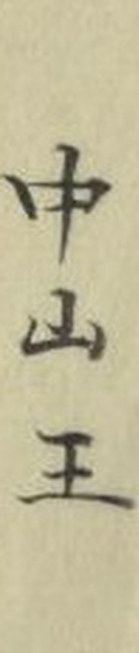中山王
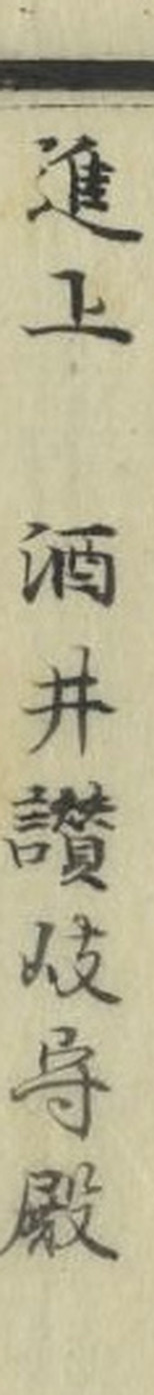進上酒井讃岐守殿
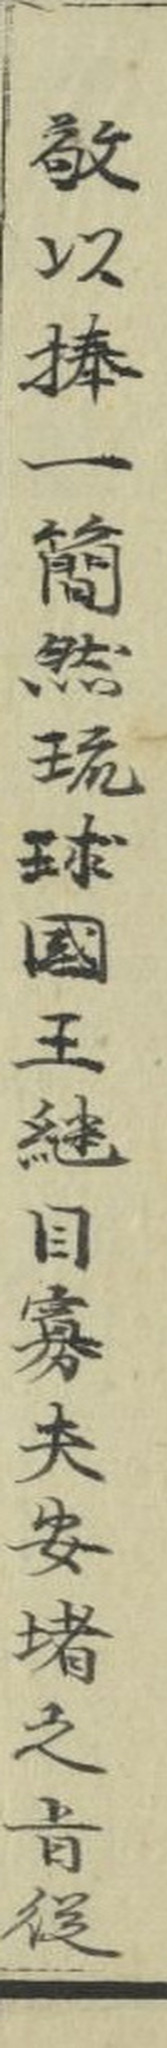敬以棒一簡然琉球国王継目寡夫安堵之旨従
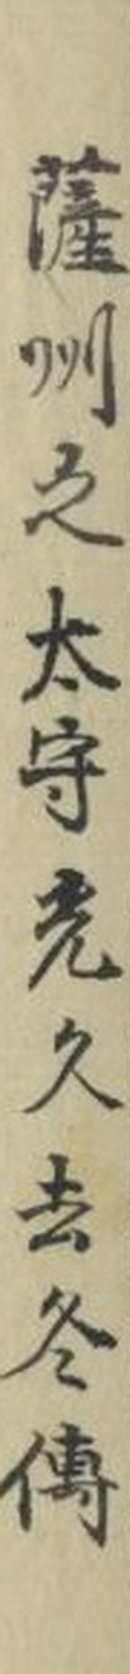薩州之太守充久去冬伝
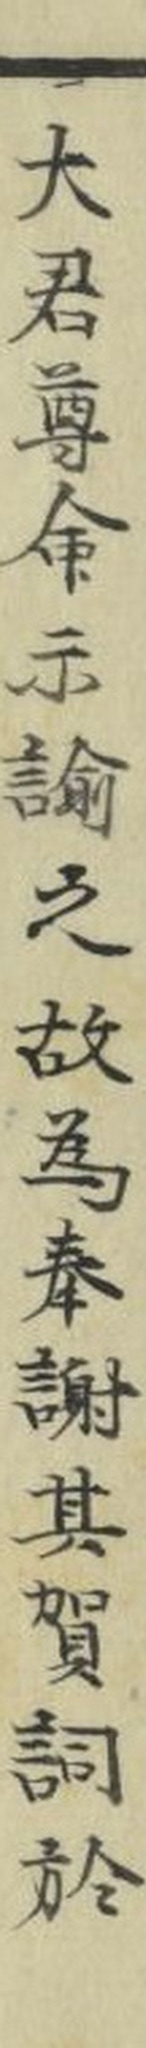大君尊命示諭之故為奉謝其賀詞於
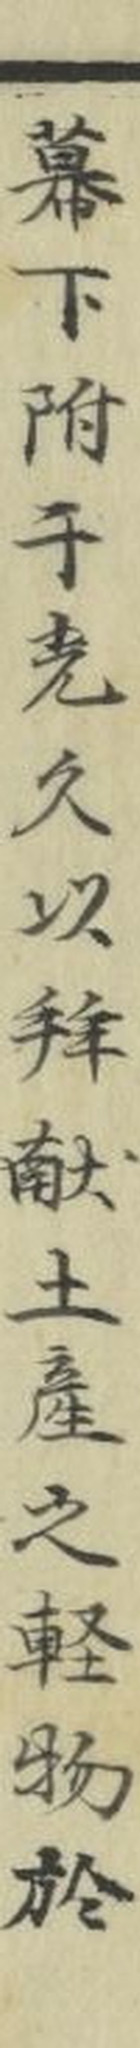幕下附于充久以拝献土産之軽物於
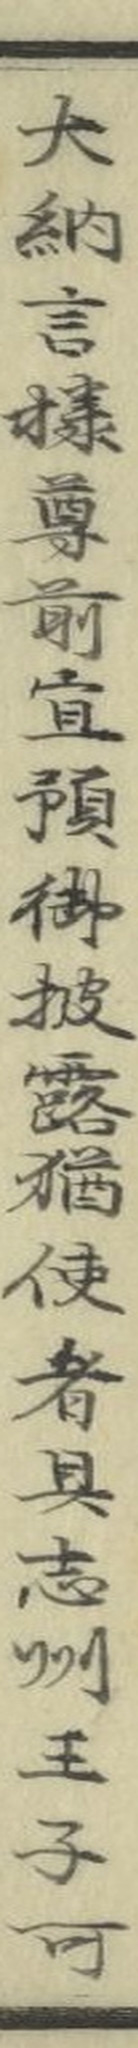大納言様尊前冝預御披露猶使者具志州王子可
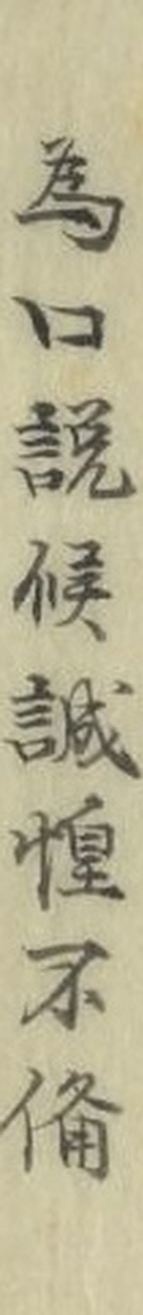為口説候誠惺不備
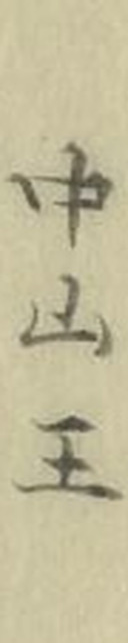中山王
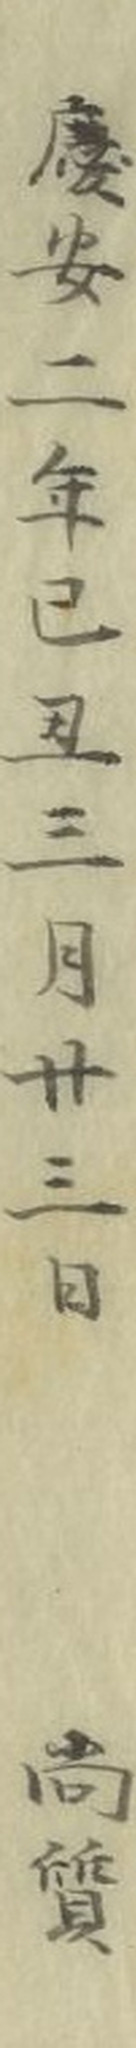慶安二年巳丑三月廿三日尚質
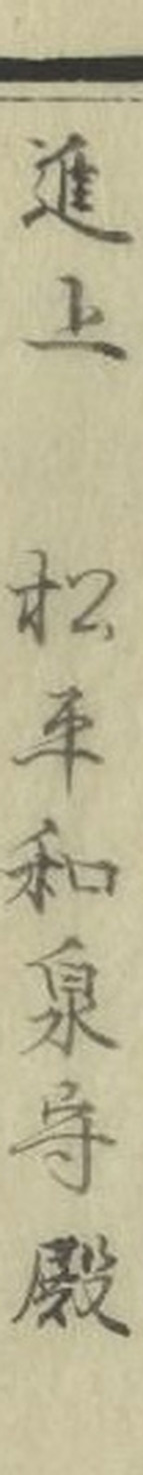進上松平和泉守殿
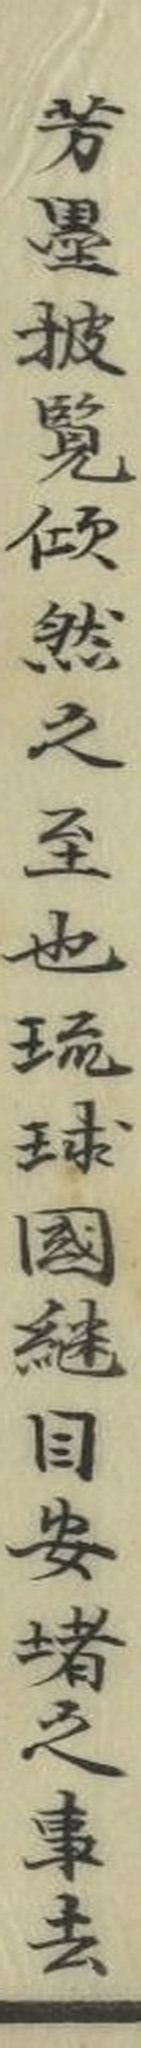芳墨披覧欣然之至也琉球国継目安堵之事去

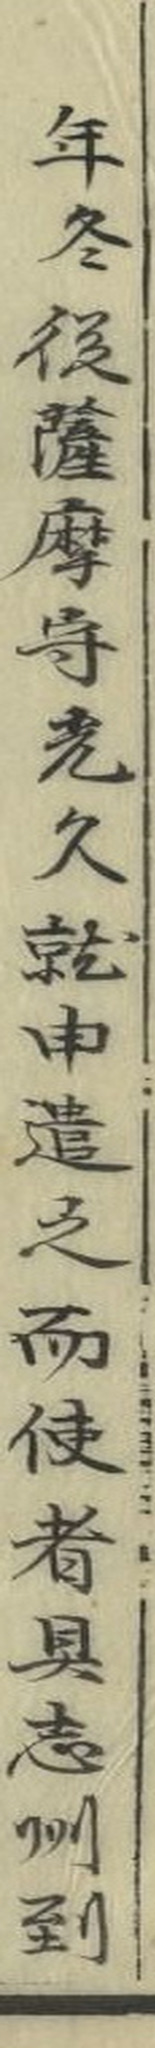年冬従薩摩守充久就申遣之而使者具志州到
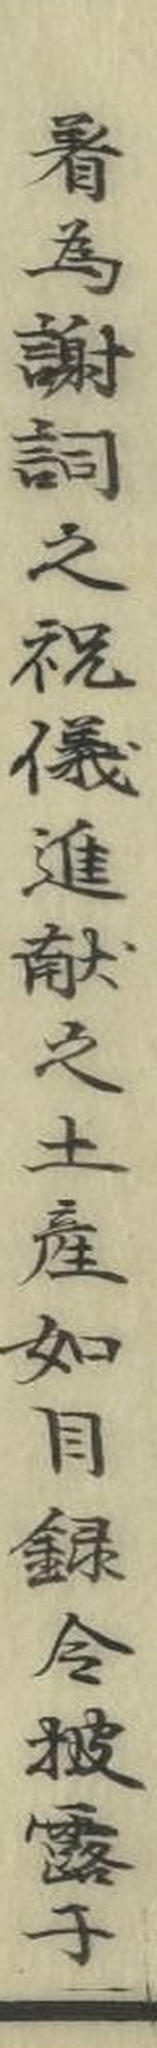着為謝詞之祝儀進献之土産如目録令披露于
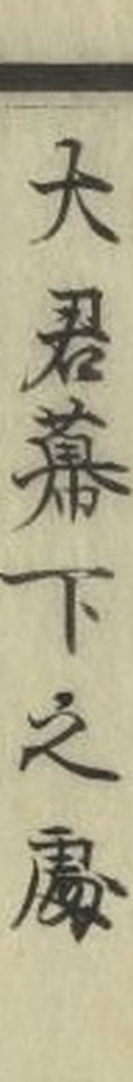大君幕下之處
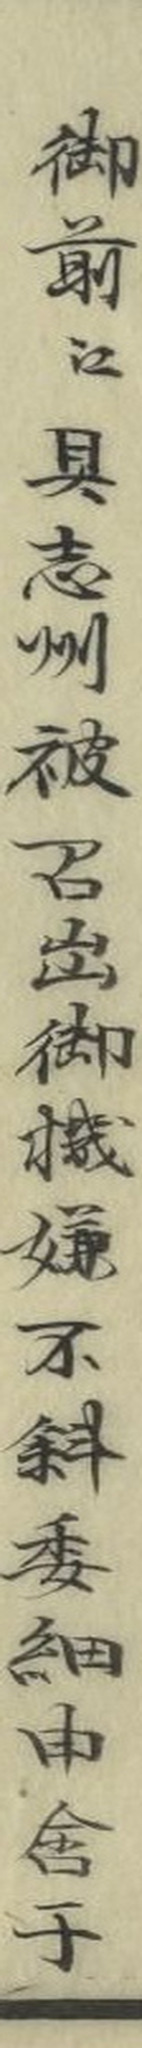御前え具志州被召出御機嫌不斜委細申于
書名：琉球往来（上）
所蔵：University of the Ryukyus Library
